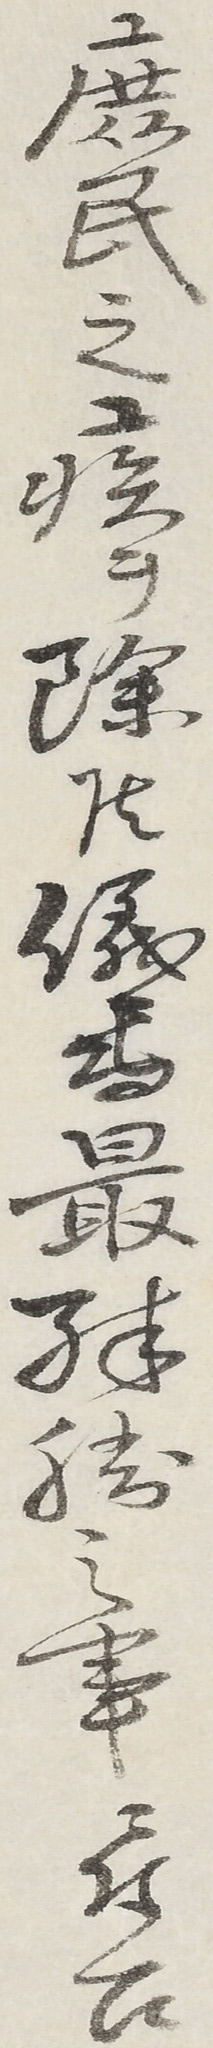庶民之疾ヲ除候儀ニ而最殊勝之事ニ付召
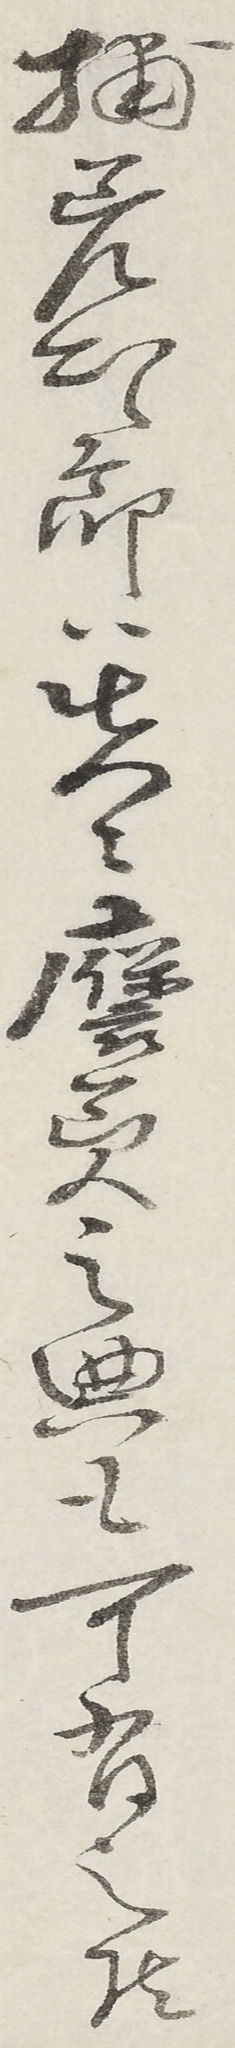捕差出候節ハ先々褒美之典も可有之候
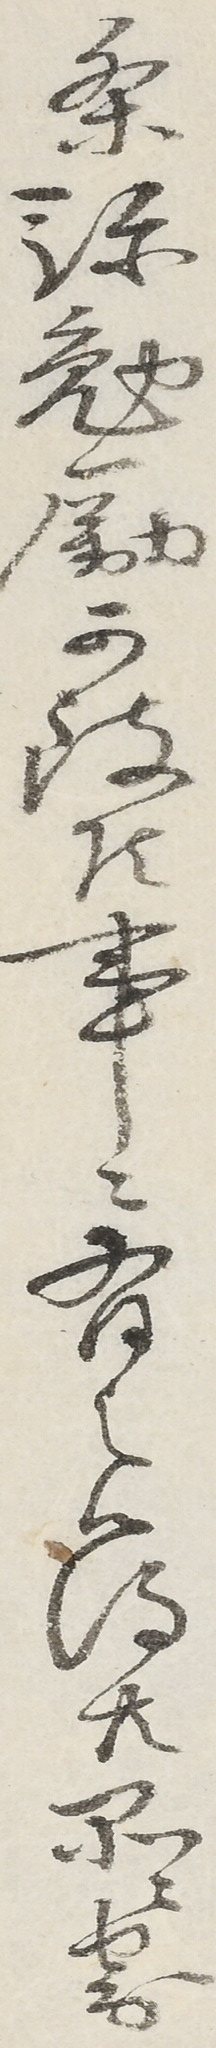条弥勉励可致候事ニ有之候得共品ニ寄
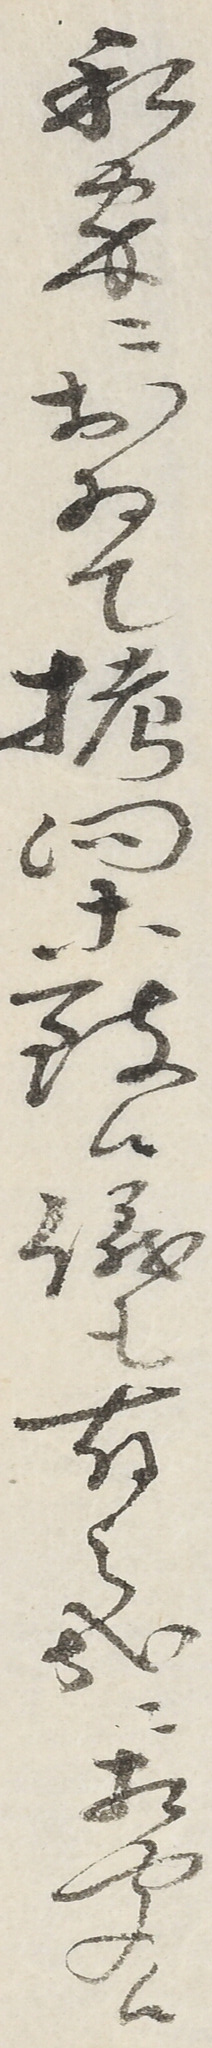私家ニおゐて拷問等致候儀も有之哉ニ相聞候
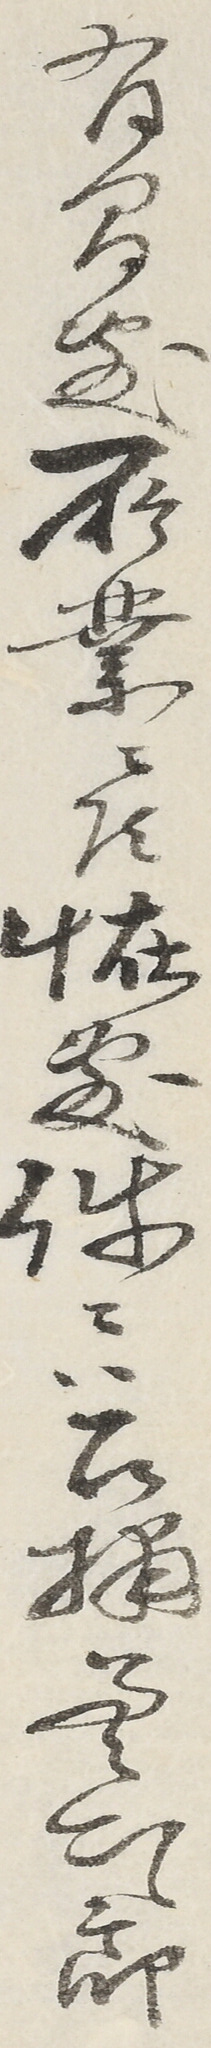有間敷所業ニ候恠敷件ニハ召捕事ニ出候節
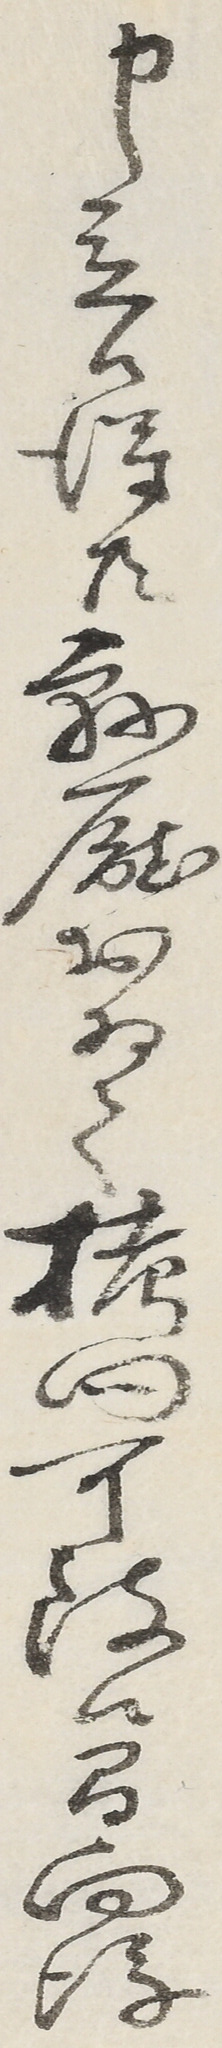申立候得共県庁おゐて拷問可致候間向後
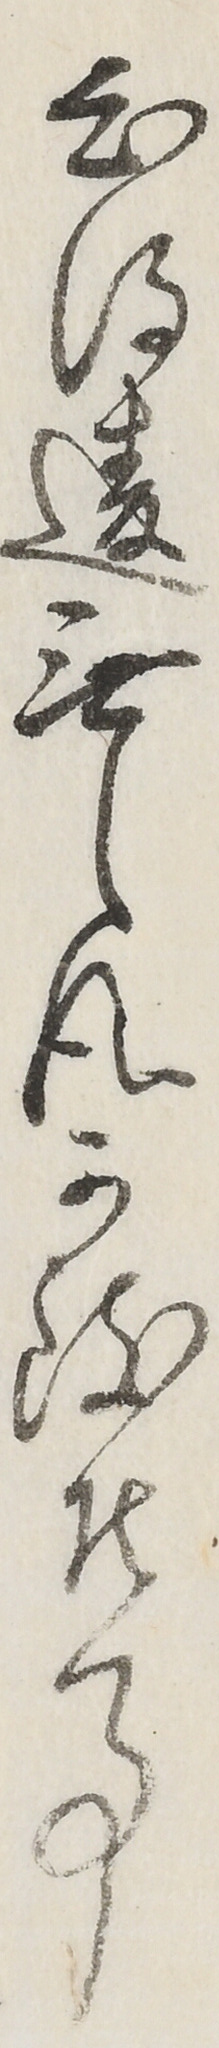心得違無之候様可致候事
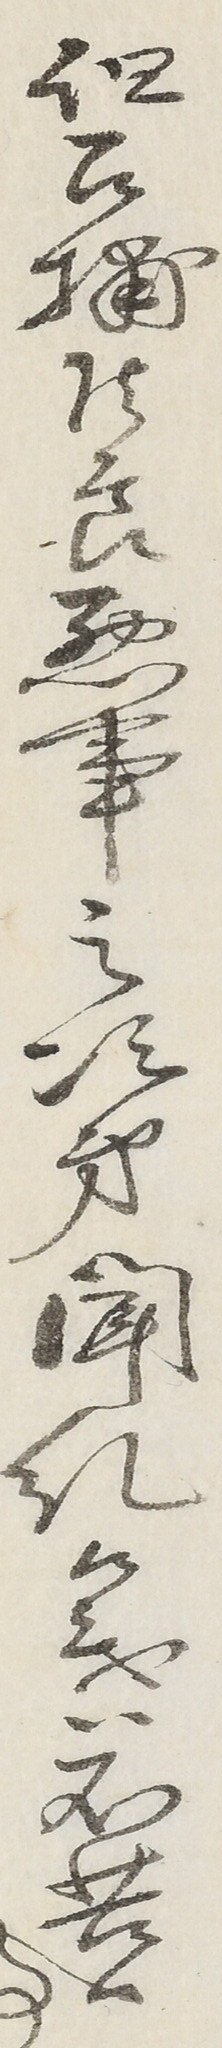但召捕候節悪事之次第聞糺候義ハ不共候事
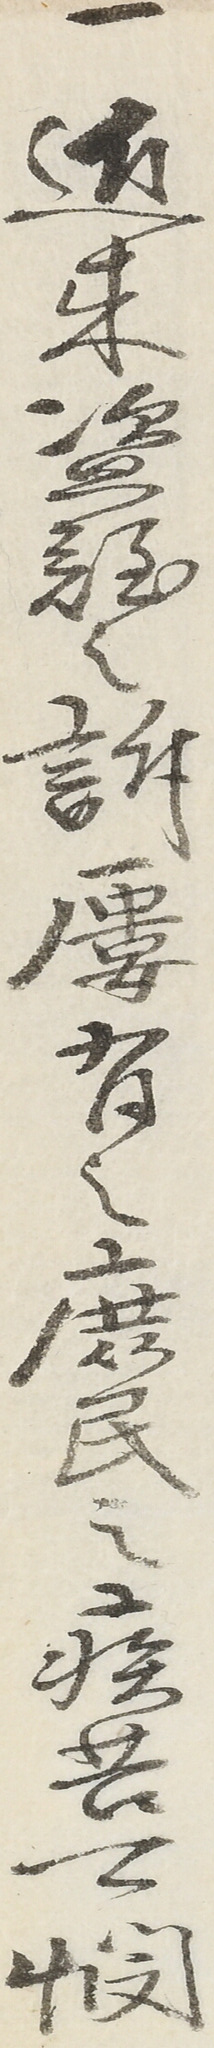一近来盗難之訴屡有之庶民之疾共可憫
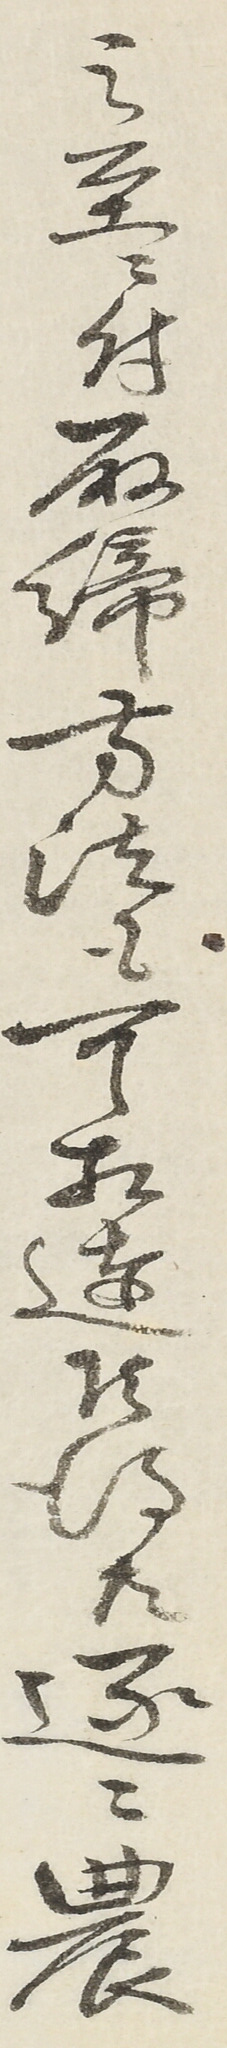之至ニ付取締方法も可相達候得共遂ニ農
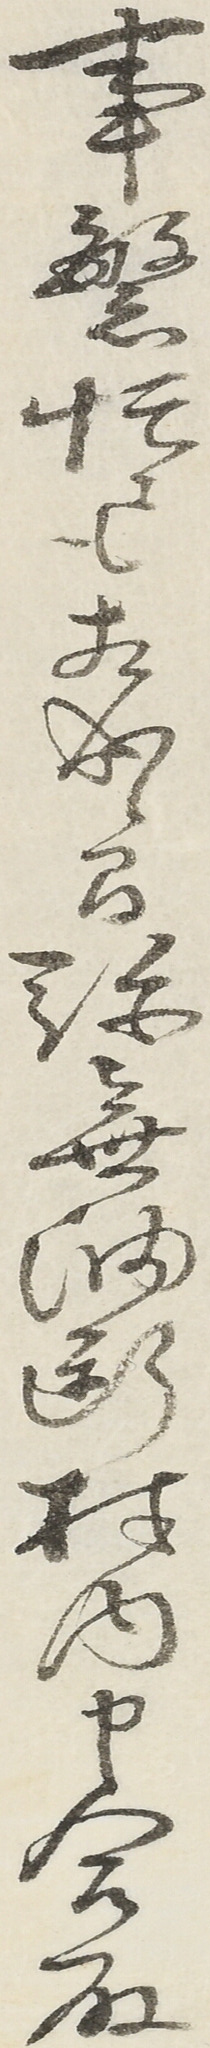事繁忙ニも相成候間弥無油断村内申合取
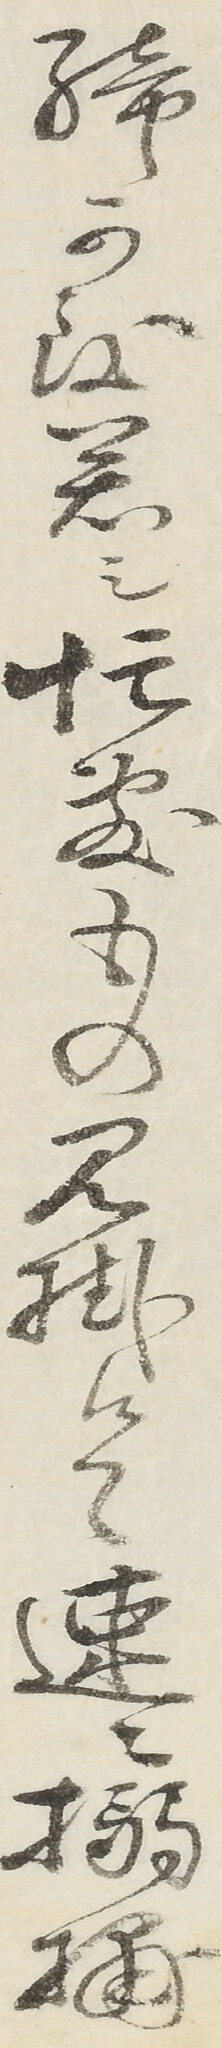締可致若シ忙敷もの見掛候ハヽ速ニ搦捕
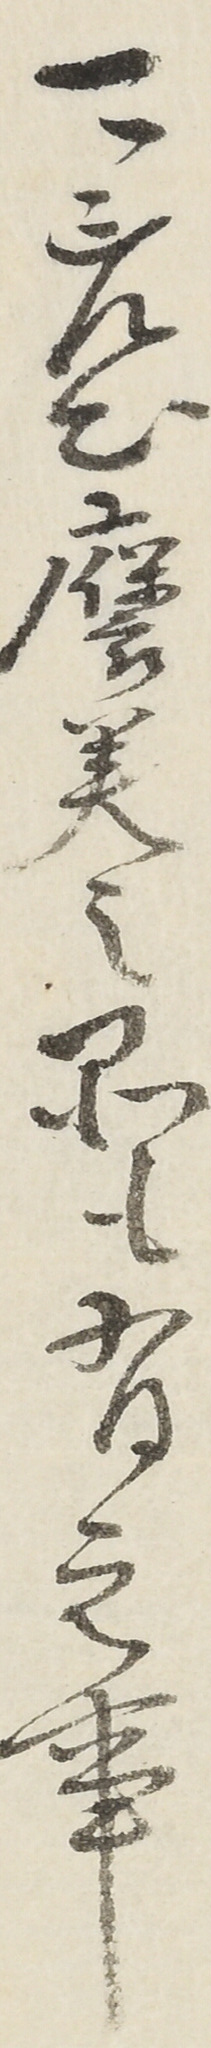可差出褒美之品も有之事

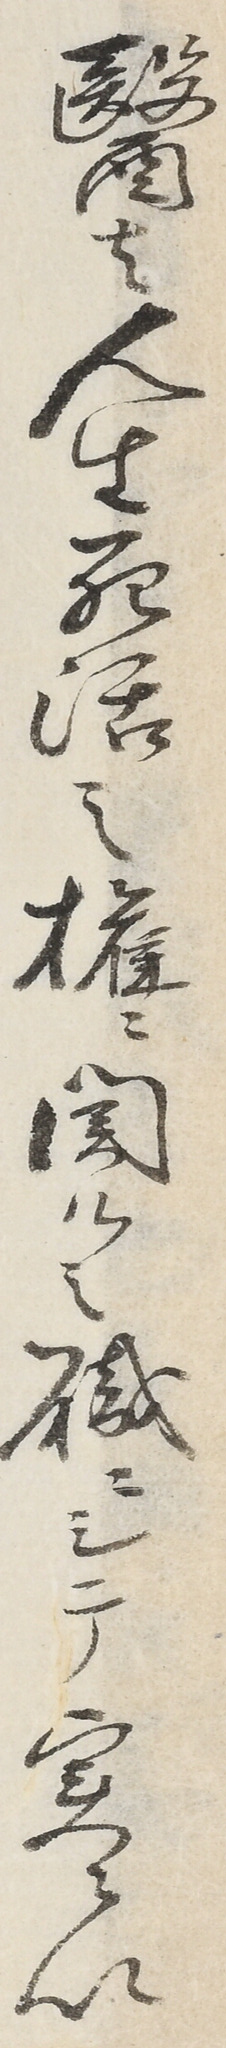医は人生死活之権ニ関ル之職ニシテ実ニ以
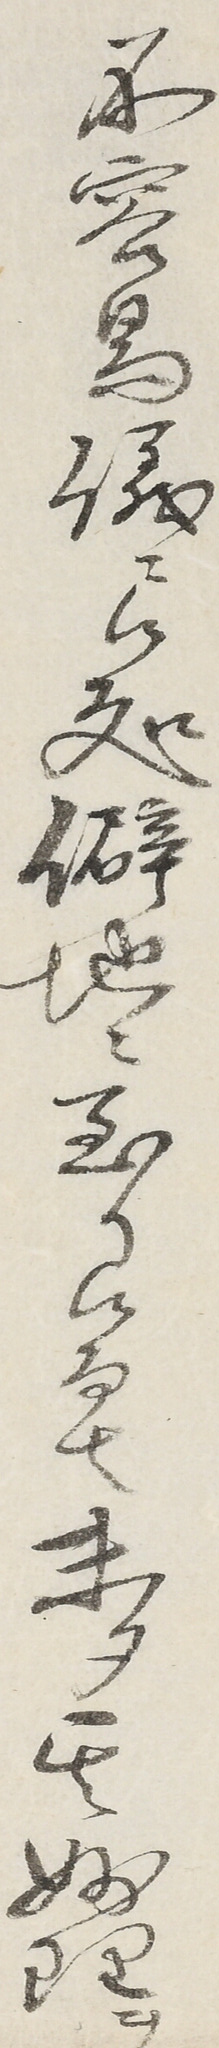不容易儀ン候処僻地ニ至り候而は未タ其妙理ヲ
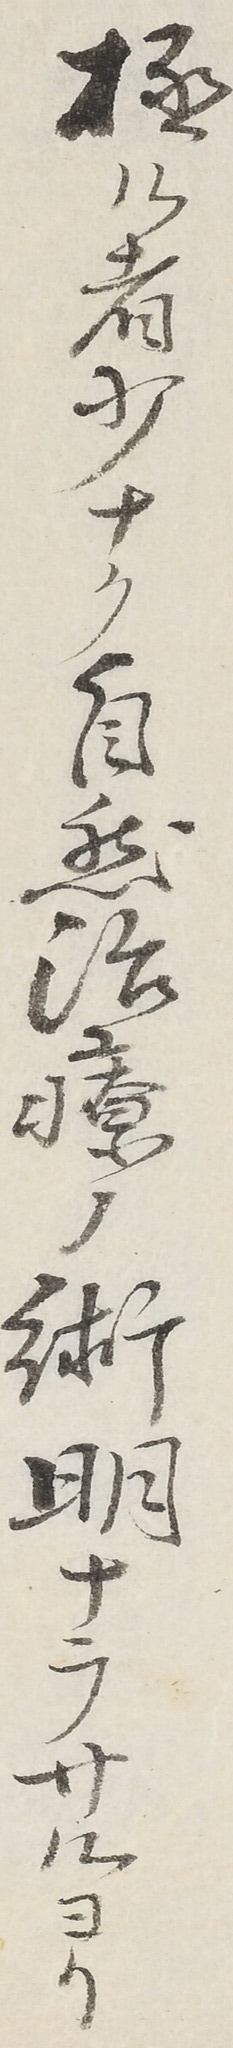極ル者少ナク自然治療ノ術明ナラサルヨリ
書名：廻状（控）
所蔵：伊那市立高遠町図書館・合同会社AMANE
